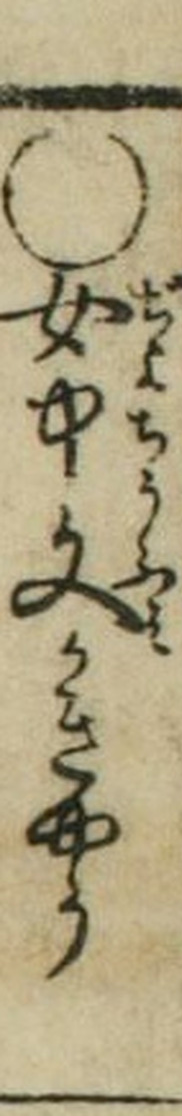○女中文かきやう
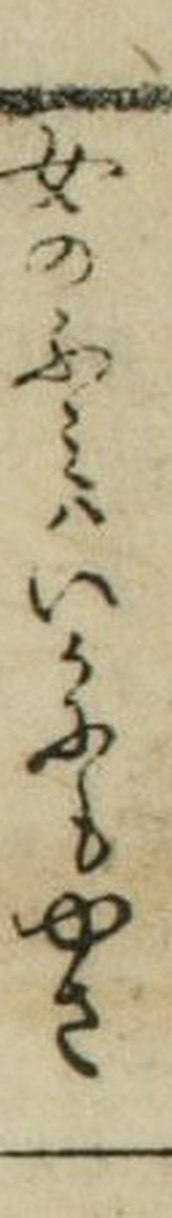女のふみはいかにもやさ
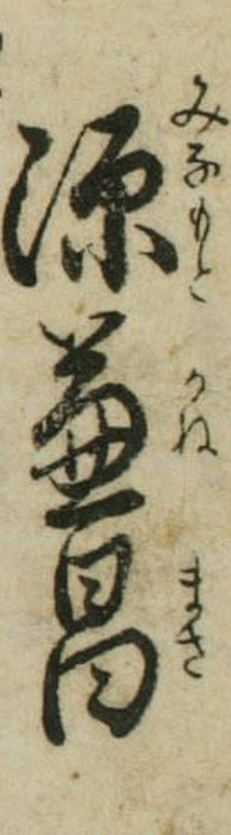源兼昌
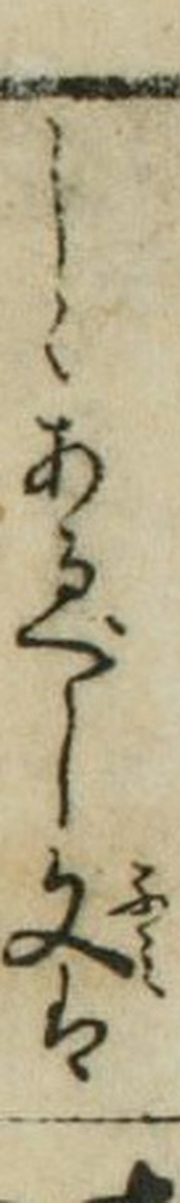しくあるべし文は
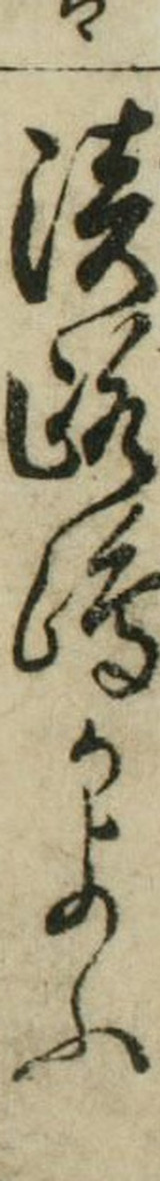淡路島かよふ
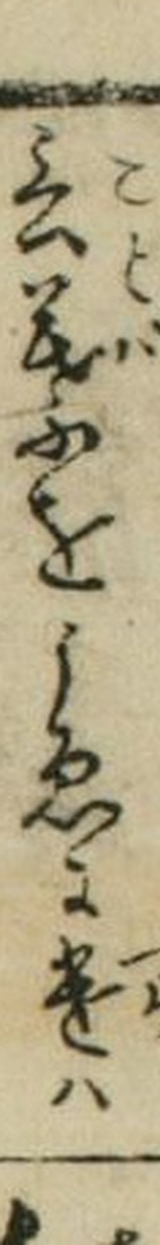言葉をうゑに遣は
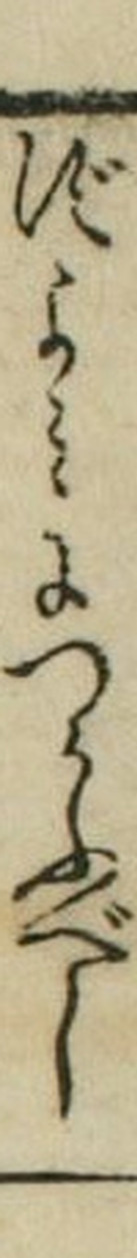ずよみにつかふべし
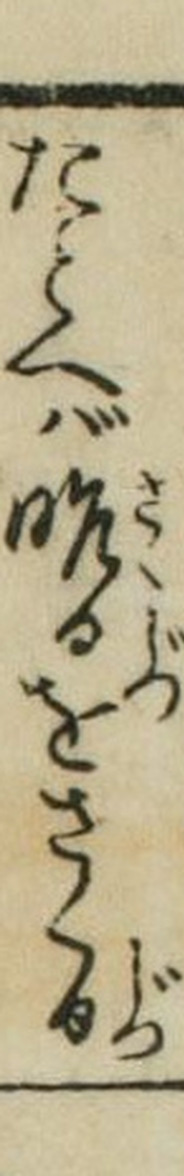たとへば昨日をさく日
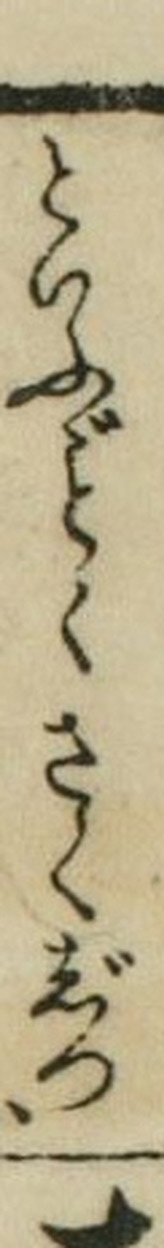といふごとくさくじつは
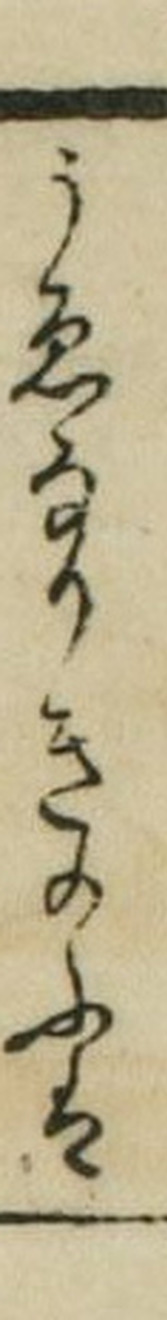うゑなりきのふは
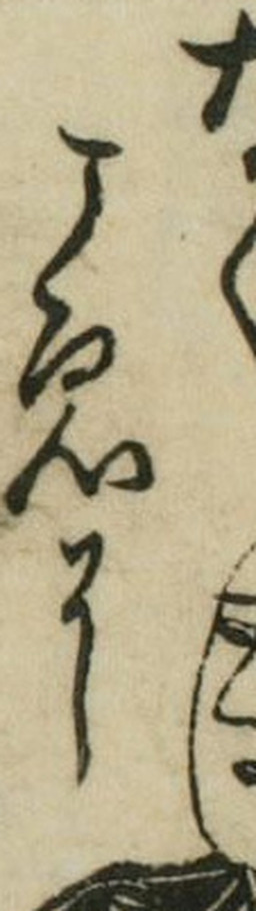こゑに
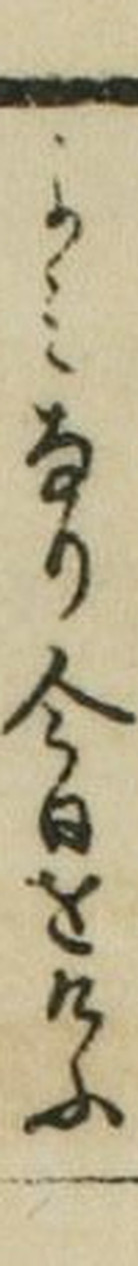よみなり今日をけふ
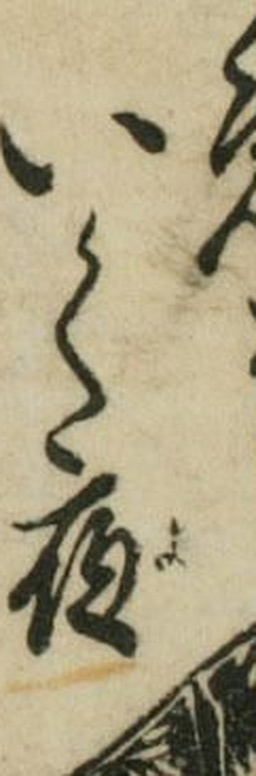いく夜
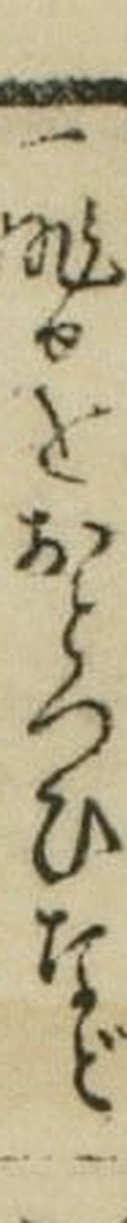一昨日をおとつひなど
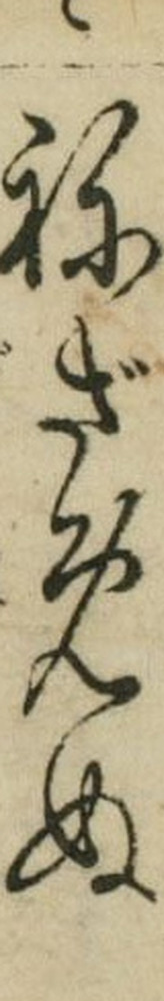ねざめぬ
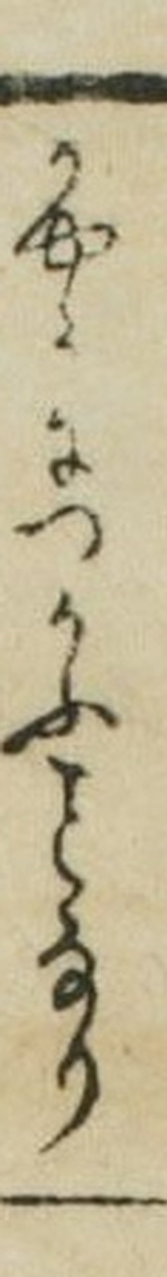かやうにつかふことなり
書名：百人一首
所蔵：東京学芸大学教育コンテンツアーカイブ
